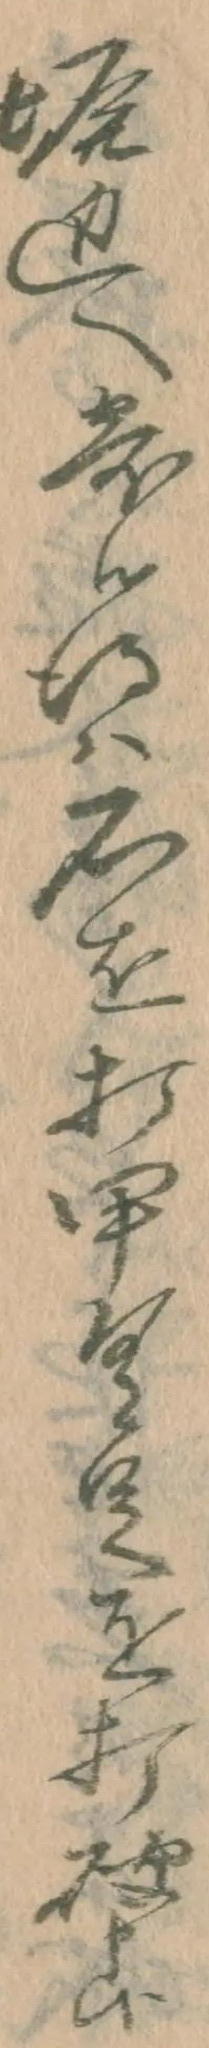一堀辺へ寄候得は石を打甲具足を打破申候
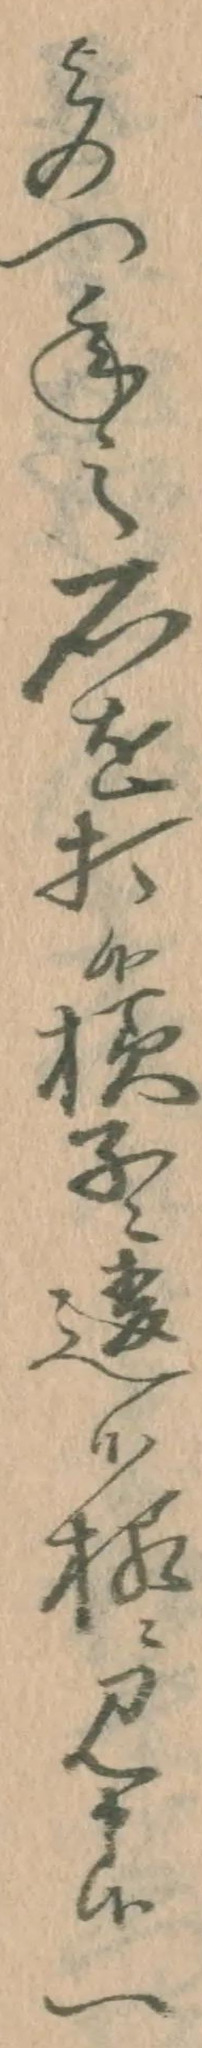与のつ手之石を打候様子に違候様に見申候一
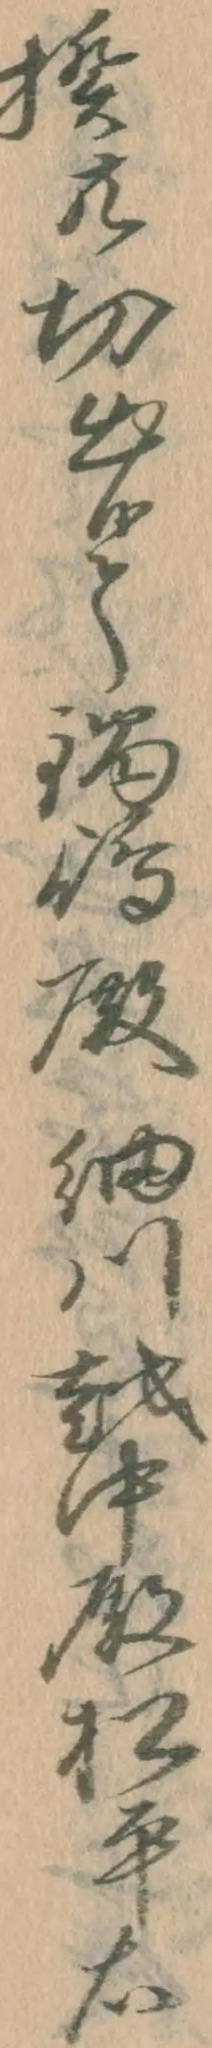揆共切出候て鍋島殿細川越中殿松平右
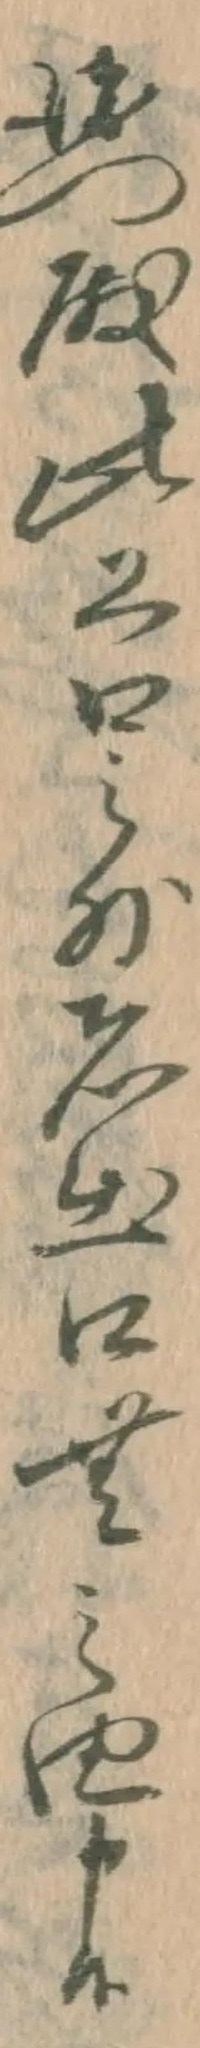衛門殿此上口之外者出口無之由申候
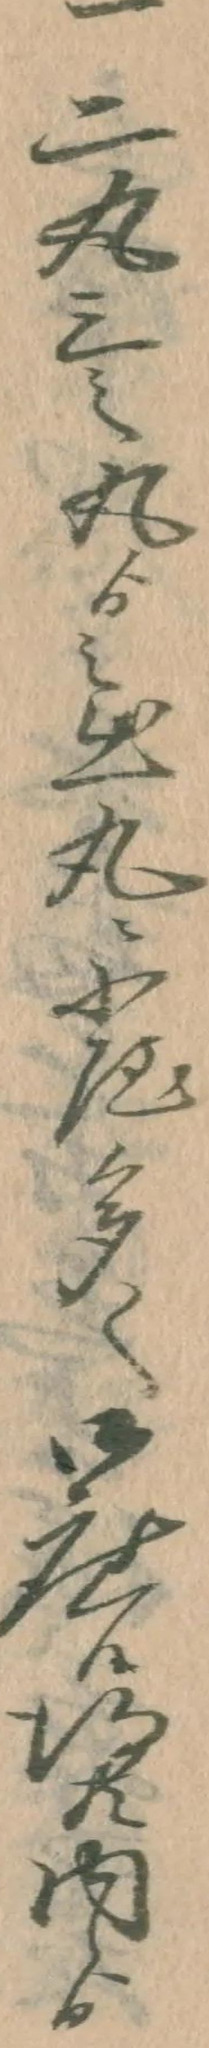一二丸三之丸ゟ之出丸に小屋多く御座候得共内ゟ
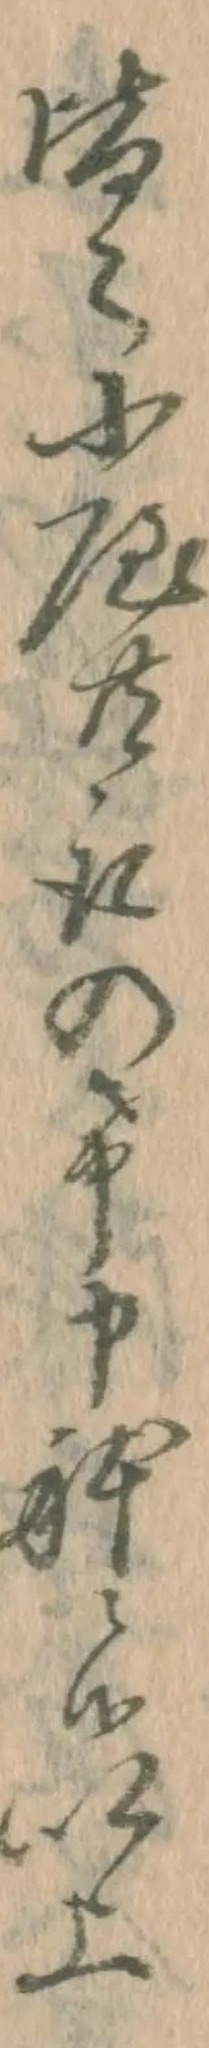皆々小屋共取の希申躰に候以上
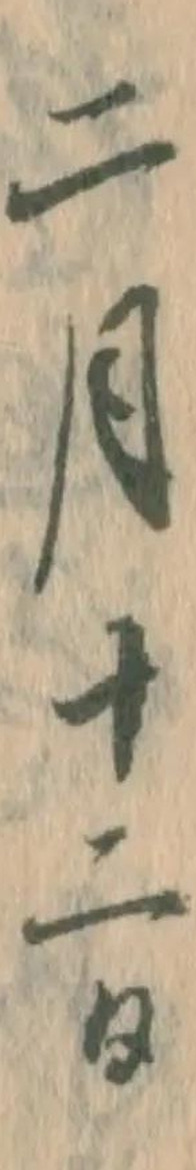二月十二日
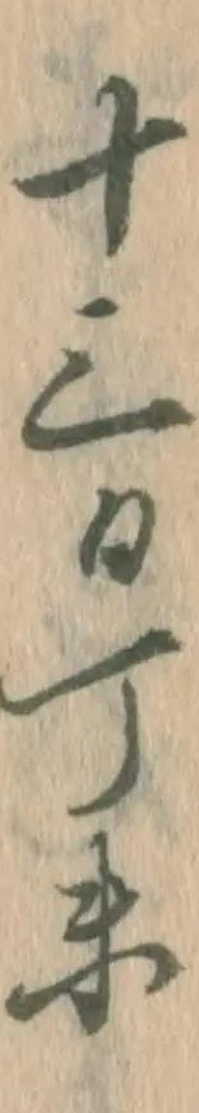十三日丁未
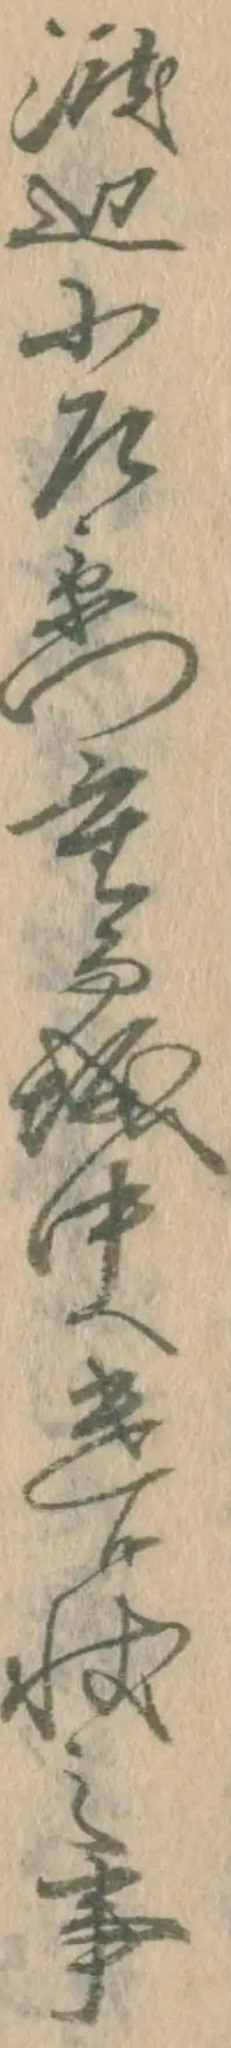渡辺小左衛門重而城中へ遣候状之事
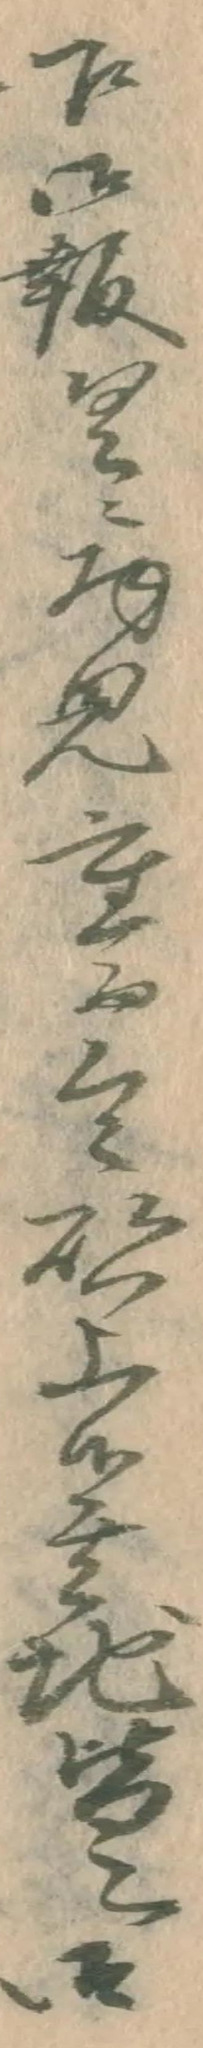乍御報具に拝見重而令啓上候其地皆々御
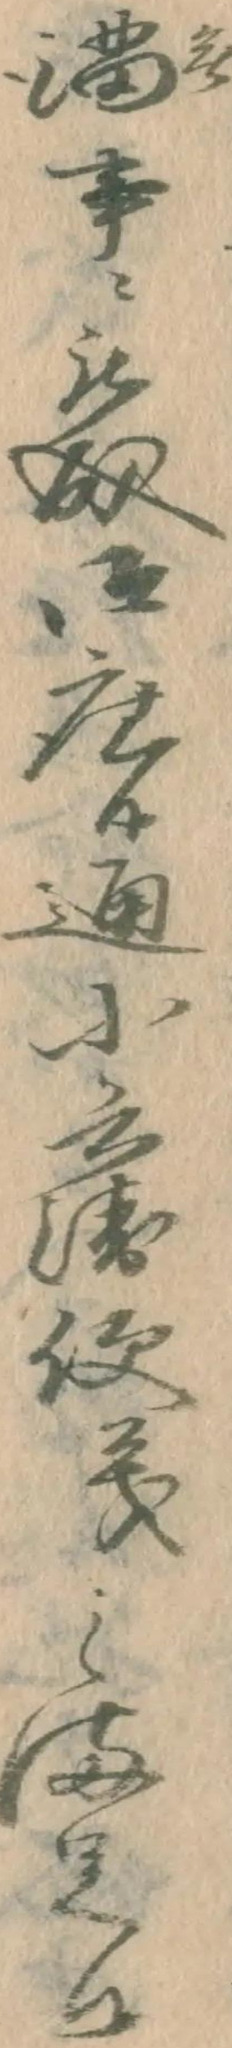無事に被成御座候通小兵衛便義之満足候

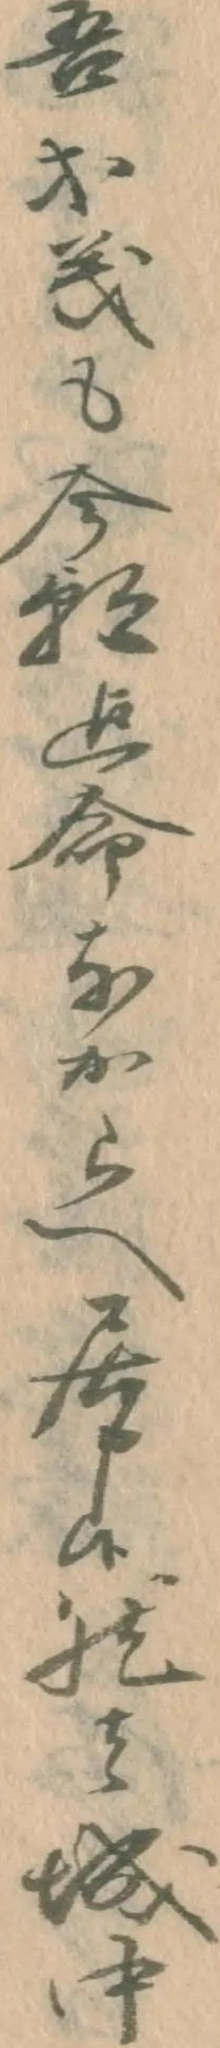吾等義も今朝迄命なからへ居候然者城中
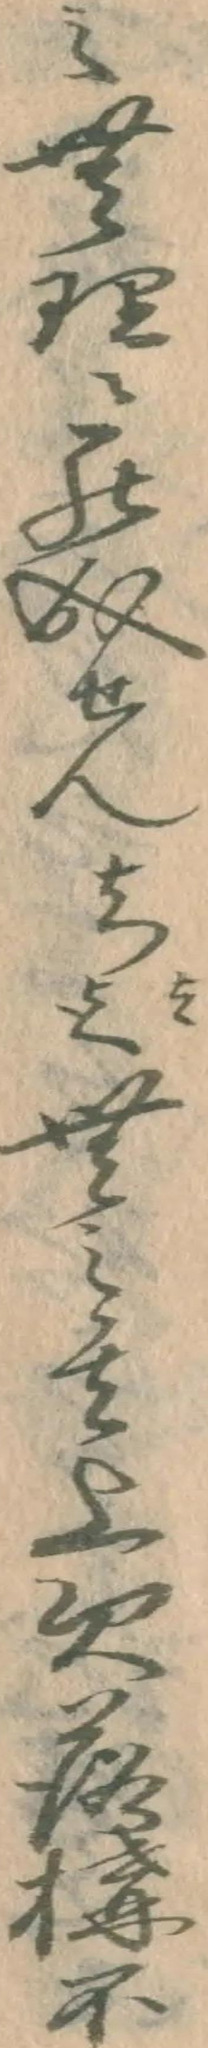之無理に罷成せんち与無之其上欠落構不
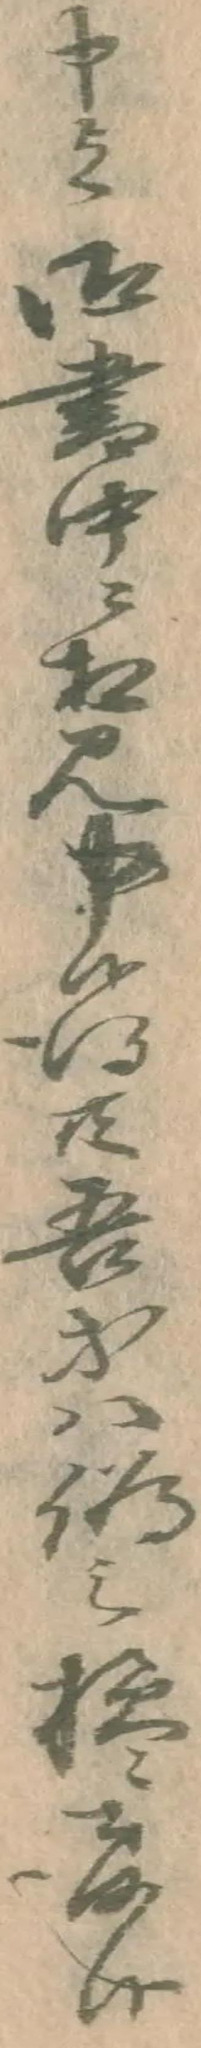申与御書中に相見申候得共吾等は偽之様に存候
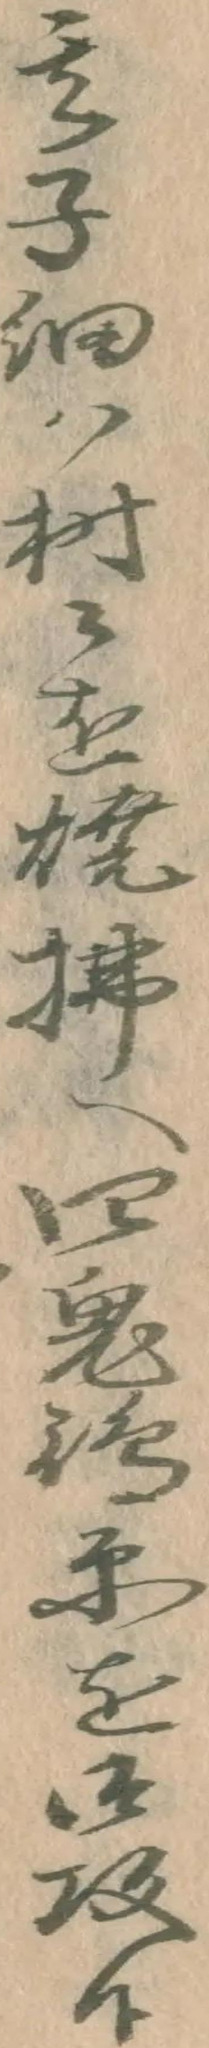其子細は村々を焼払へ四鬼島原を御攻候
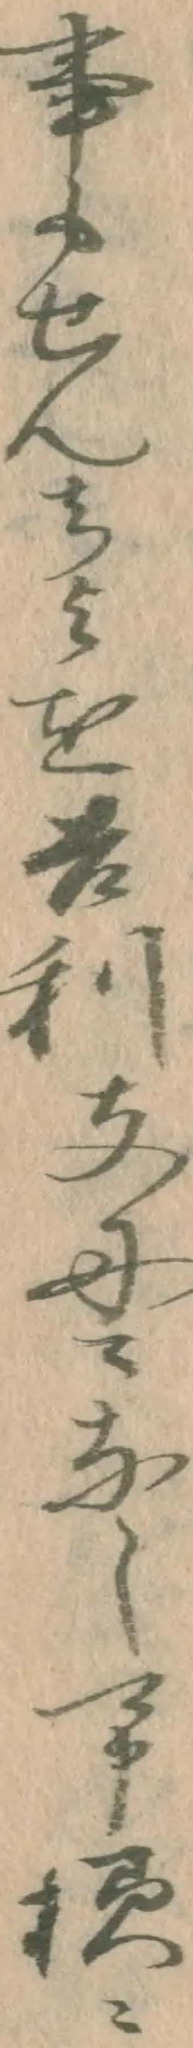事もせんち与を吉利支丹になし可申様に
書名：切支丹御退治記 49巻. [6]
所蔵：国立国会図書館 National Diet Library, JAPAN
